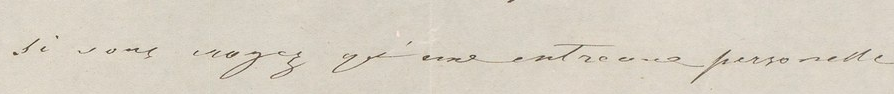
Si vous croyez qu'une entrevue personelle
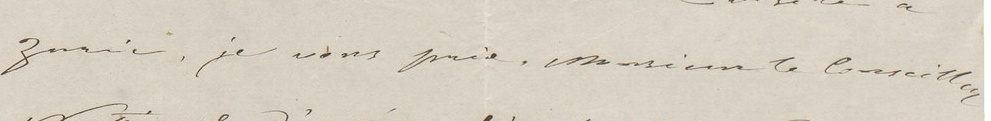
Zuric, je vous prie, Monsieur le Conseiller
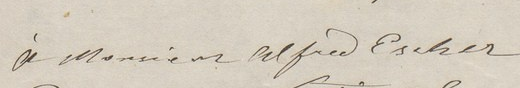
À Monsieur Alfred Escher
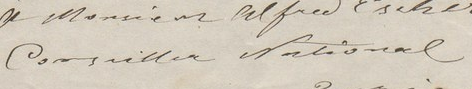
Conseiller National
